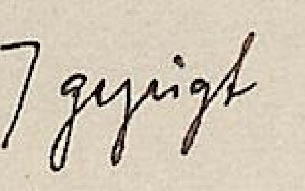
] gezeigt
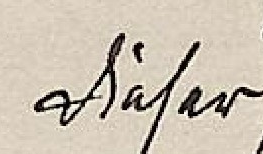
Dieser
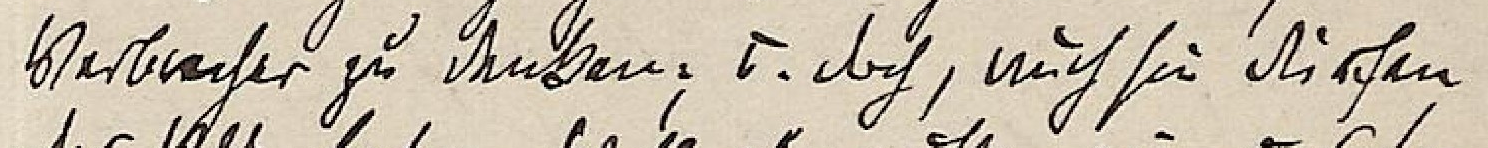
Verbrecher zu denken; u. doch, auch sie dürfen
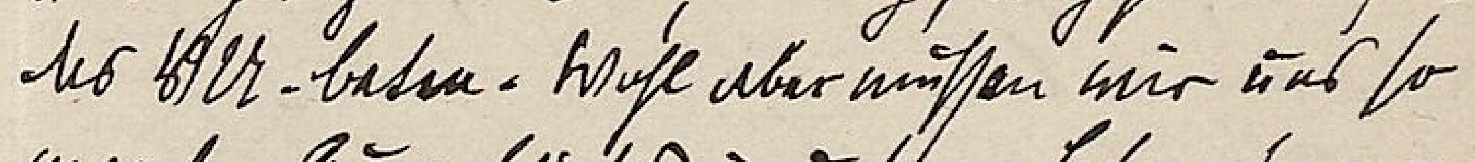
das VU. beten. Wohl aber müssen wir uns so
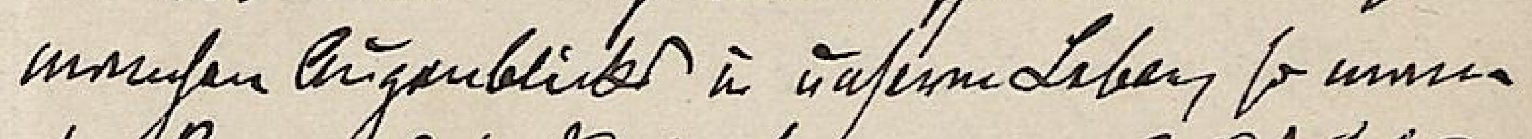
manchen Augenblicks in unserem Leben, so man¬
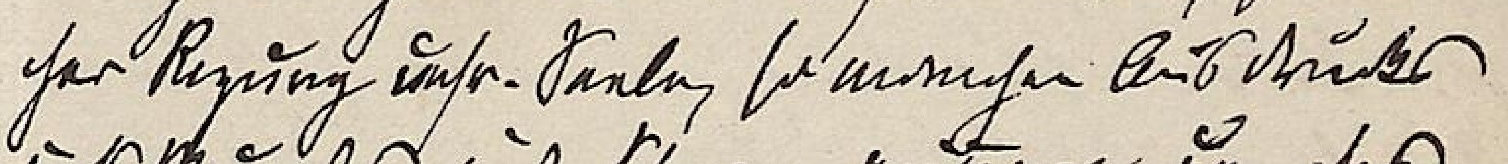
cher Regung unsr. Seele, so manchen Ausdrucks
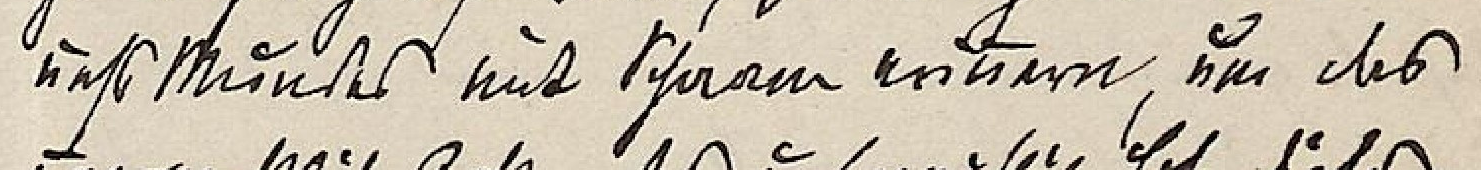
unss Mundes mit Scharm erinnern, um das
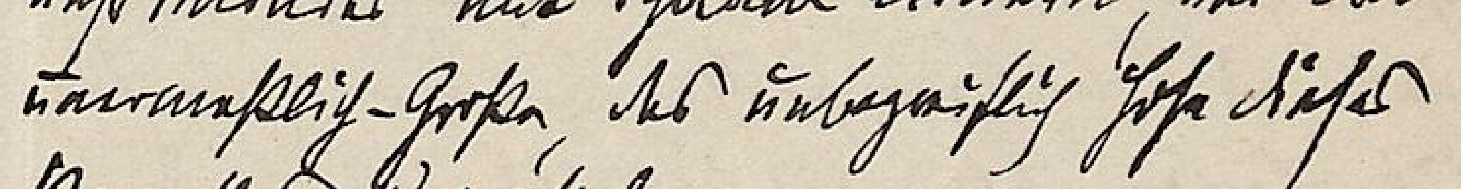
unermeßlich_Große, das unbegreiflich Hohe dieses
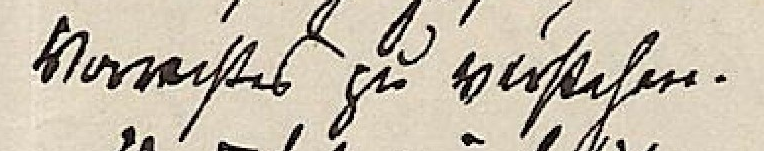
Vorrechte zu verstehen.
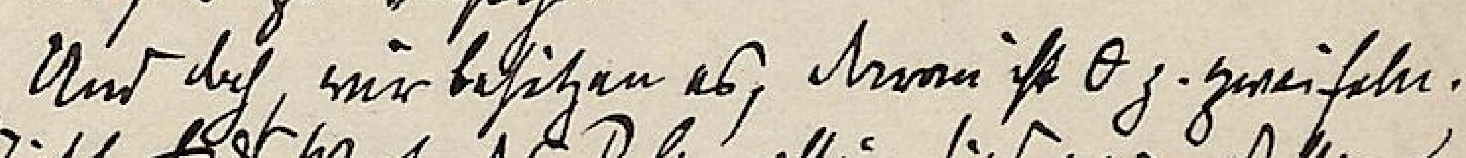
Und doch, wir besitzen es daran, ist o z. zweifeln.
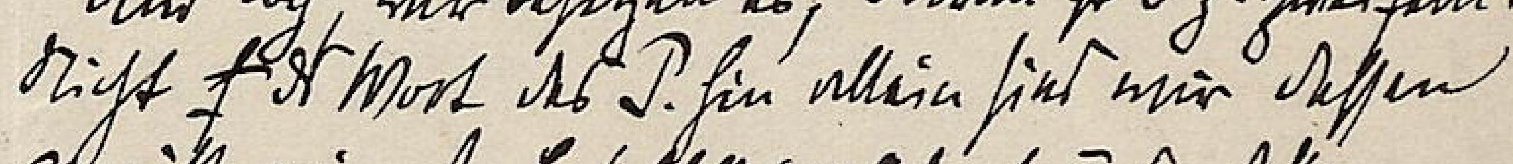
Nich f. ds Wort des P. hin allein sind wir dessen
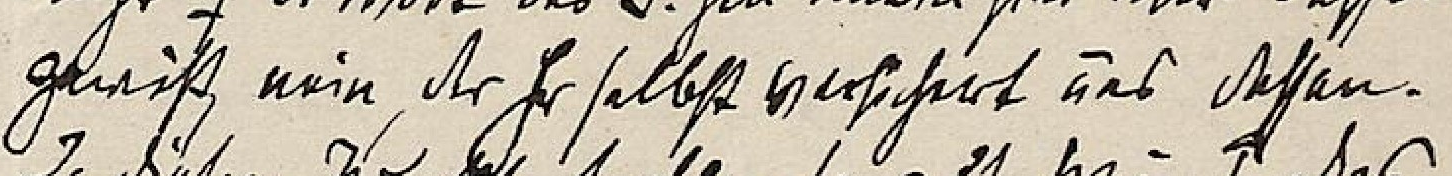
gewiß, nein, der Hr. selbst versichert uns dessen.
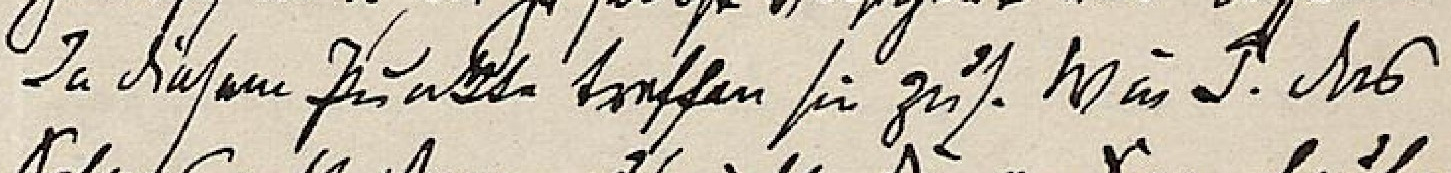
In diesem Punkt trefen sie zu. Wie P. das
